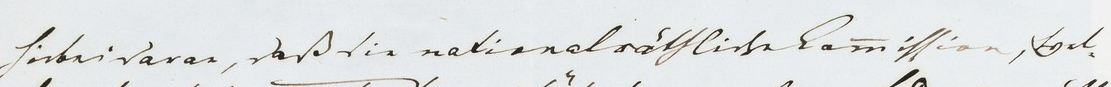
hiebei daran, daß die nationalräthliche Commission, wel-
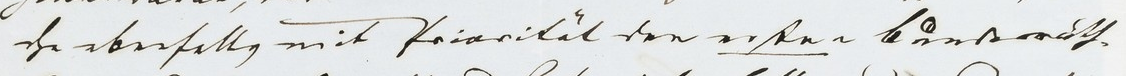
che ebenfalls mit Priorität den ersten bundesräth-
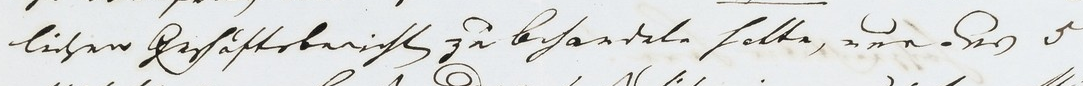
lichen Geschäftsbericht zu behandeln hatte, nur aus 5
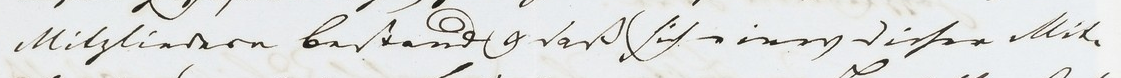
Mitgliedern bestand & daß sich eines dieser Mit-
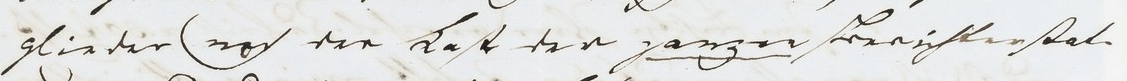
glieder noch der Last der ganzen Berichterstat-
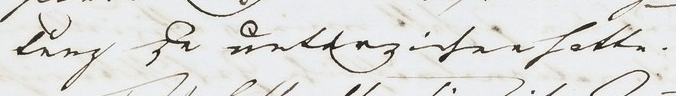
tung zu unterziehen hatte.
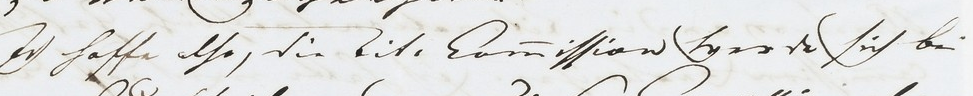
Ich hoffe, die Tit. Commission werde sich bei
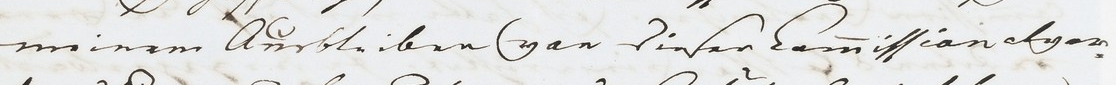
meinem Ausbleiben von dieser Commissionalver-
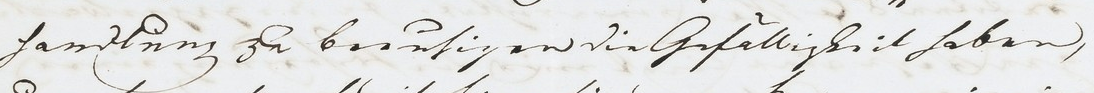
handlung zu beruhigen die Gefälligkeit haben,
